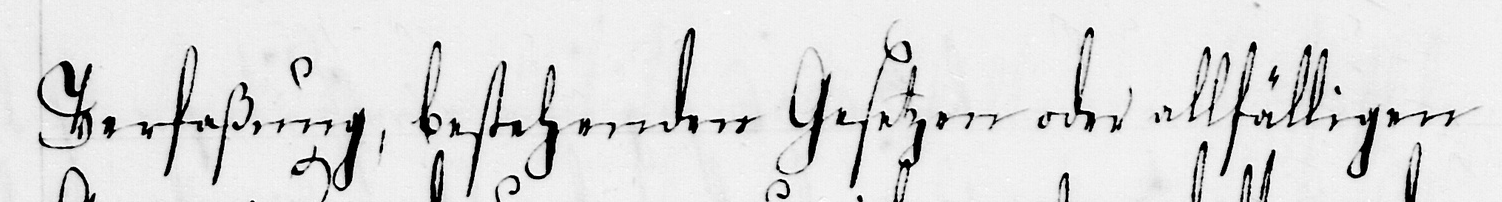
Verfaßung, bestehenden Gesetzen oder allfälligen
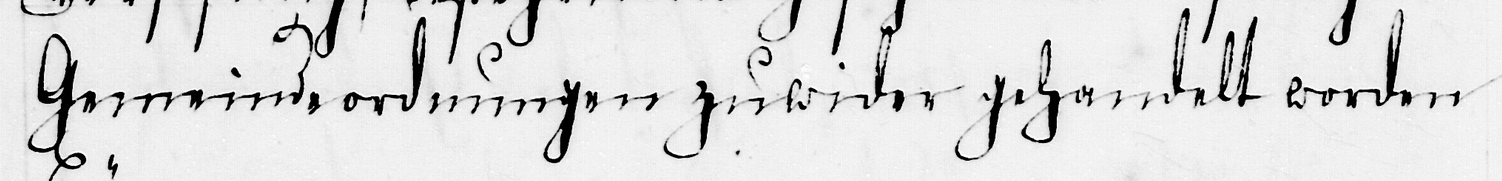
Gemeindeordnungen zuwider gehandelt worden
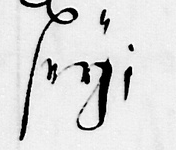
sey;
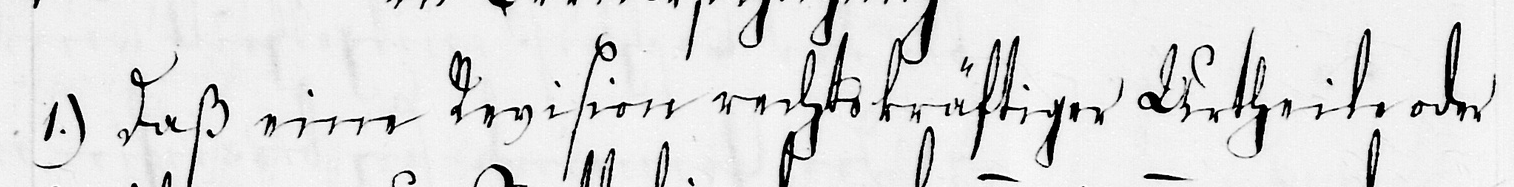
1.) Daß eine Revision rechtskräftiger Urtheile oder
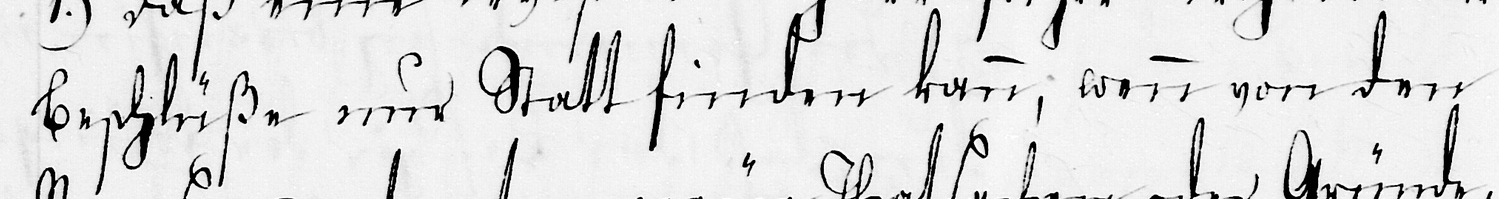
Beschlüße nur Statt finden kann, wenn von den
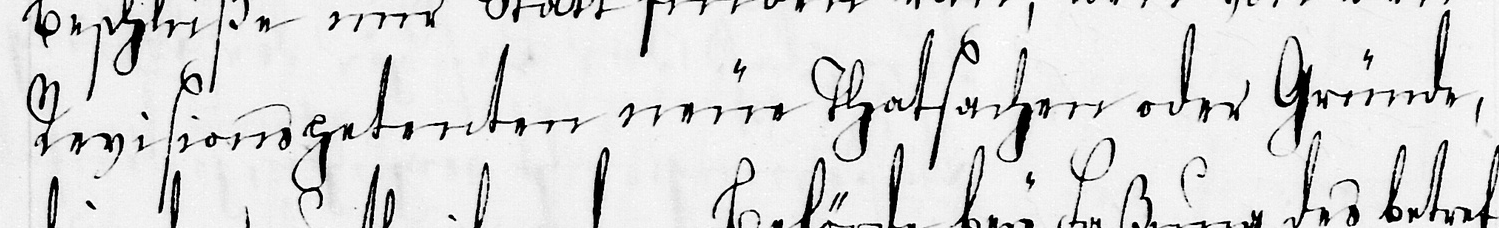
Revisionspetenten neue Thatsachen oder Gründe,
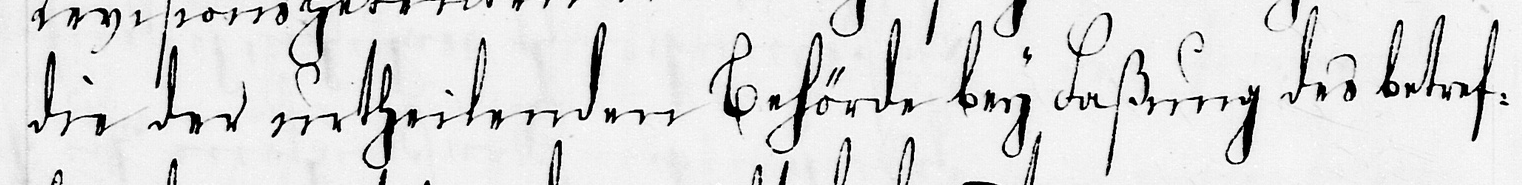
die der urtheilenden Behörde bey Faßung des betre¬
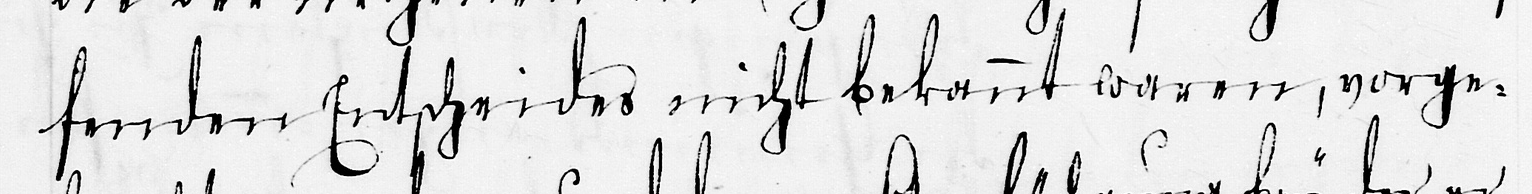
ffenden Entscheides nicht bekannt waren, vorge¬
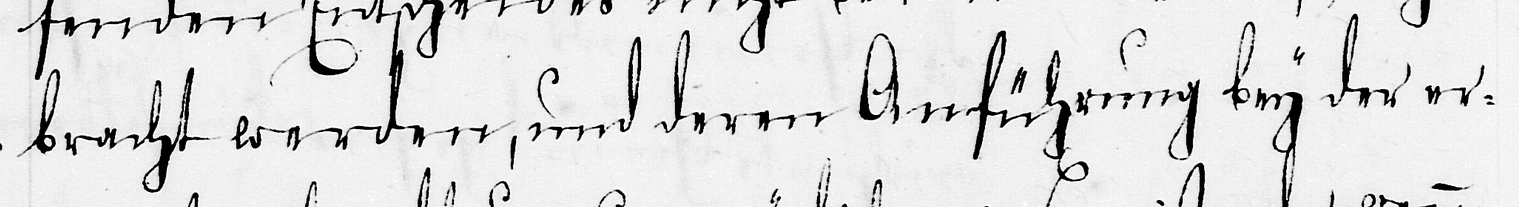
bracht werden, und deren Anführung bey der er¬
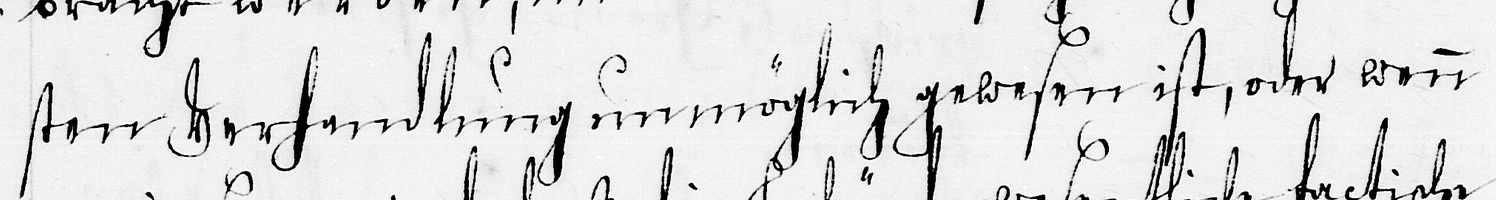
sten Verhandlung unmöglich gewesen ist, oder wenn
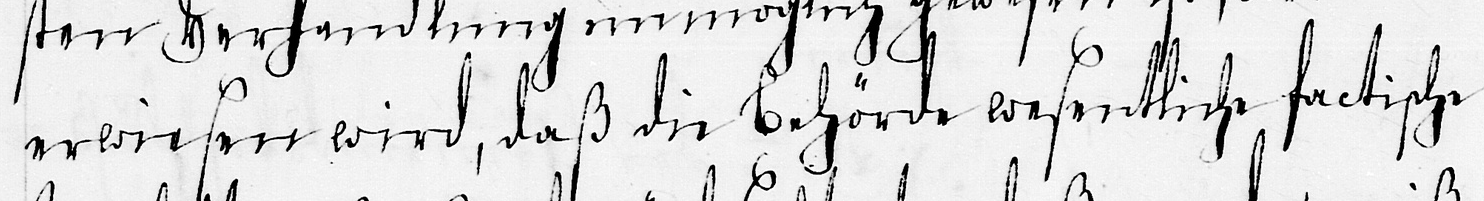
erwiesen wird, daß die Behörde wesentliche factische
